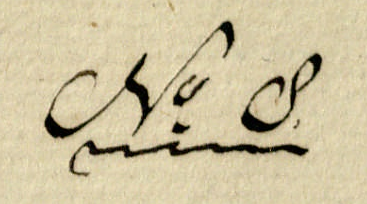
No. 8.
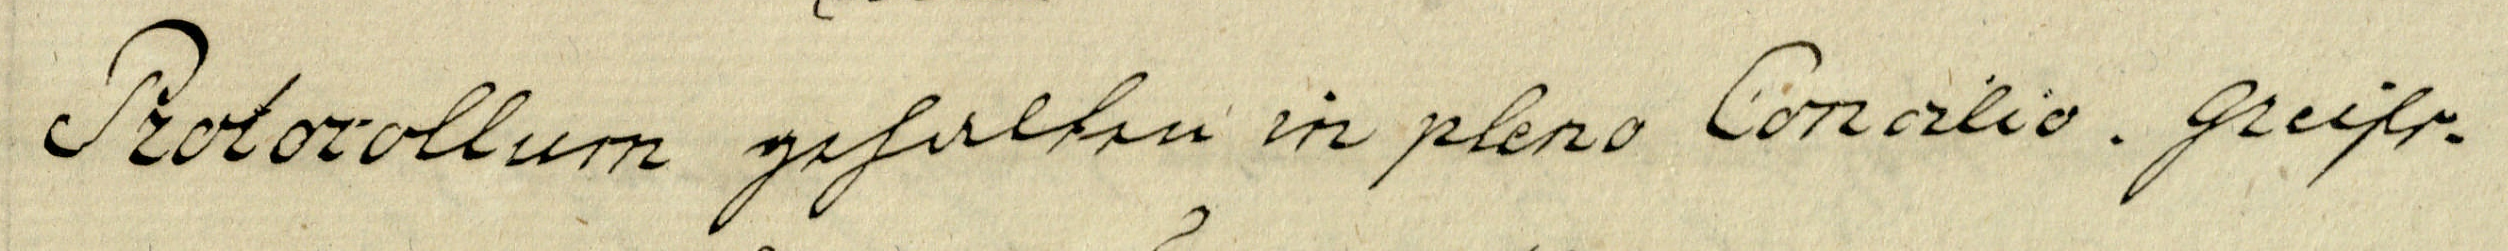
Protocollum gehalten in pleno Concilio. Greifs¬
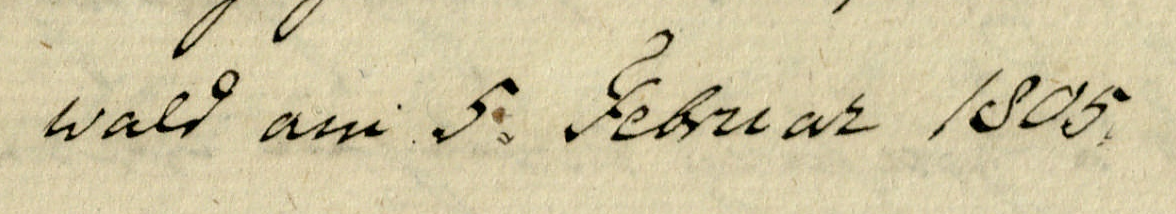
wald am 5. Februar 1805.
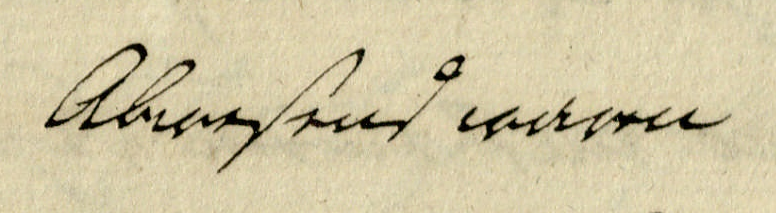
Abwesend waren
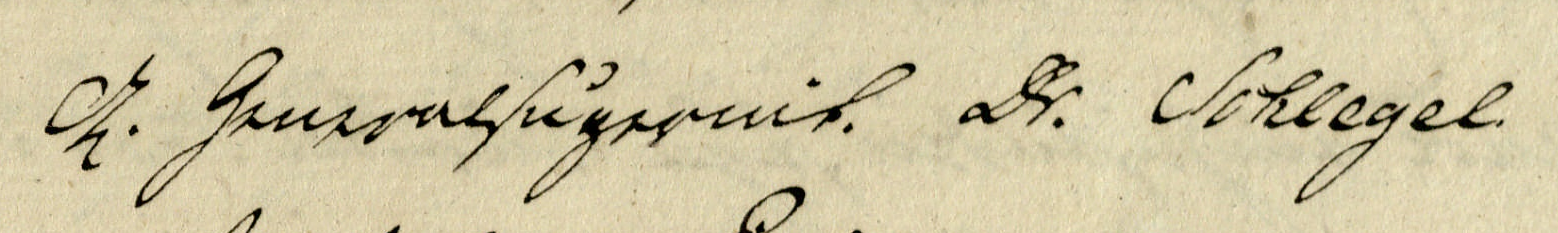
dh. Generalsuperint. Dr. Schlegel
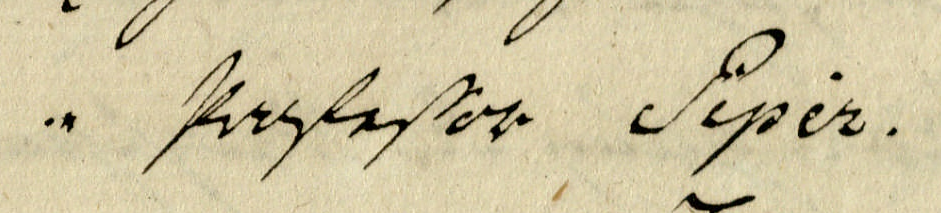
Professor Piper.
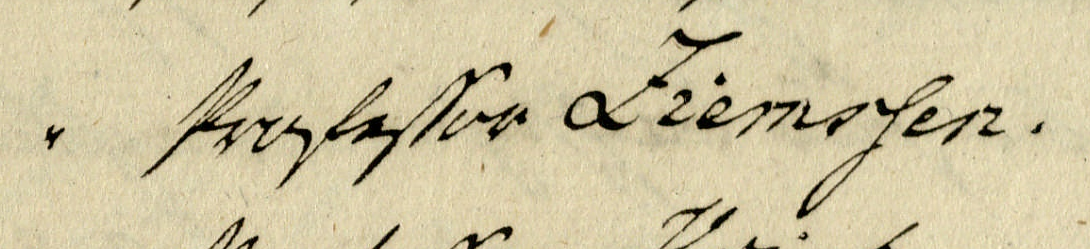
Professor Ziemssen.
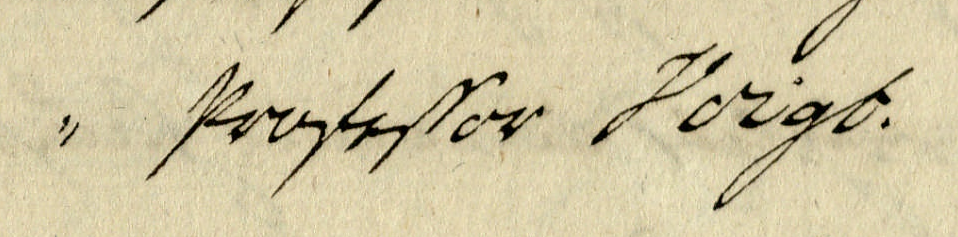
Professor Voigt.
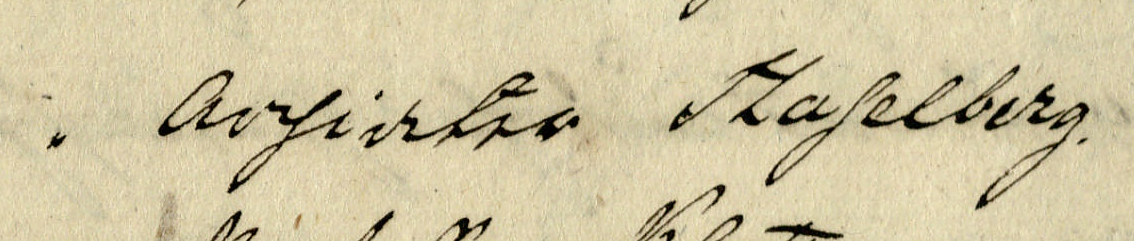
Archiater Haselberg.
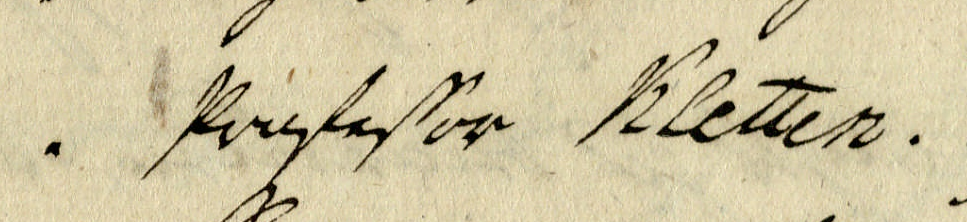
Professor Kletten.
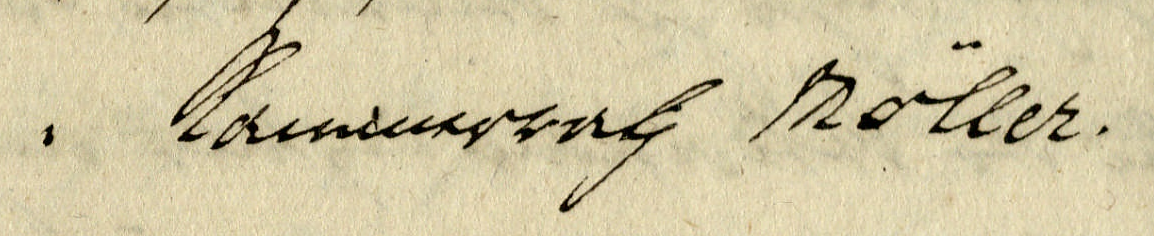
Kammerrath Möller.
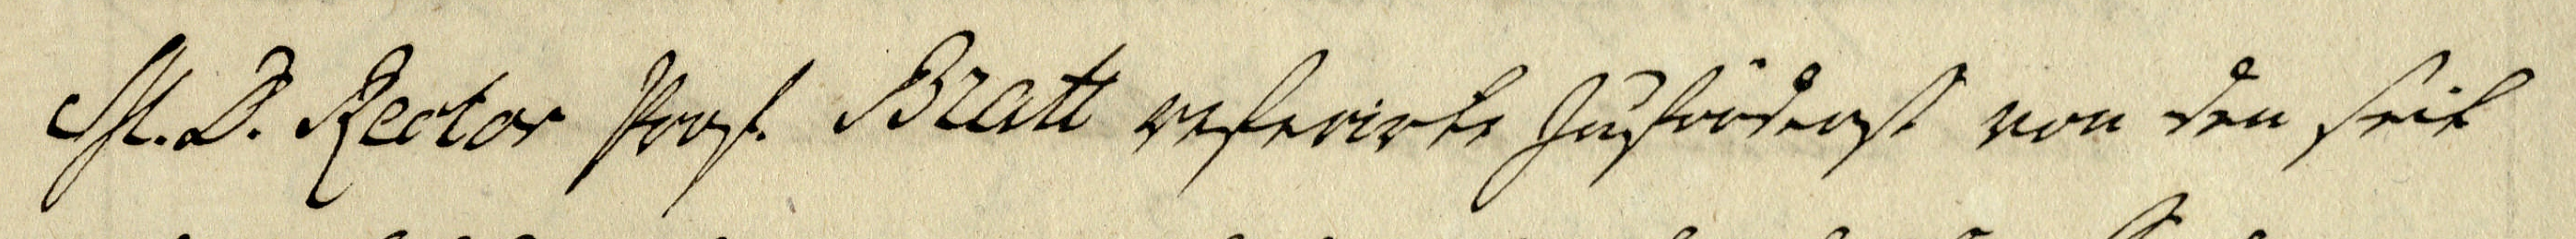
M. D. Rector Prof. Bratt referirte zuförderst von den seit
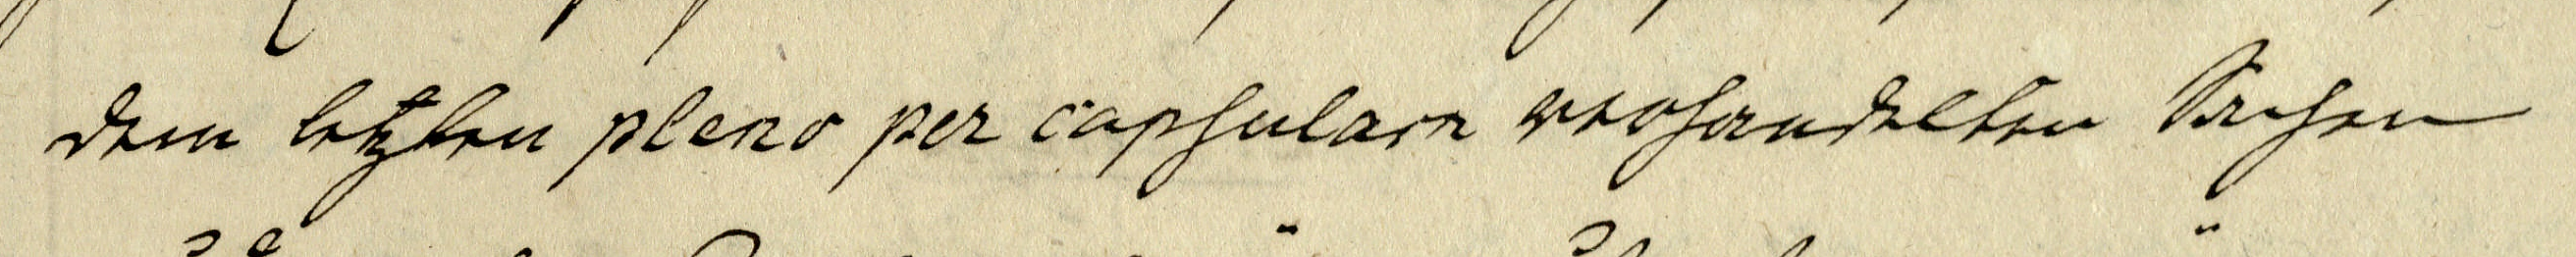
dem letzten pleno per capsulam verhandelten Sachen
